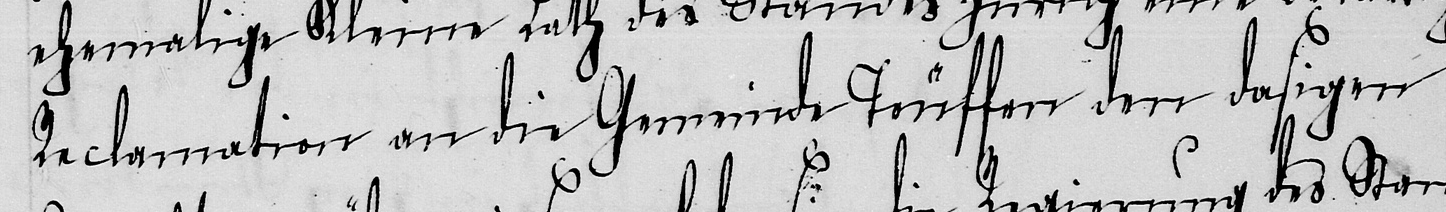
Reclamation an die Gemeinde Teuffen den dasigen
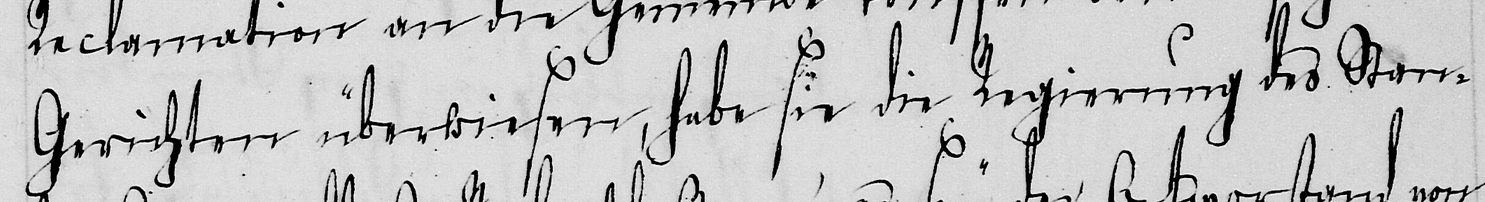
Gerichten überwiesen, habe sie die Regierung des Stan¬
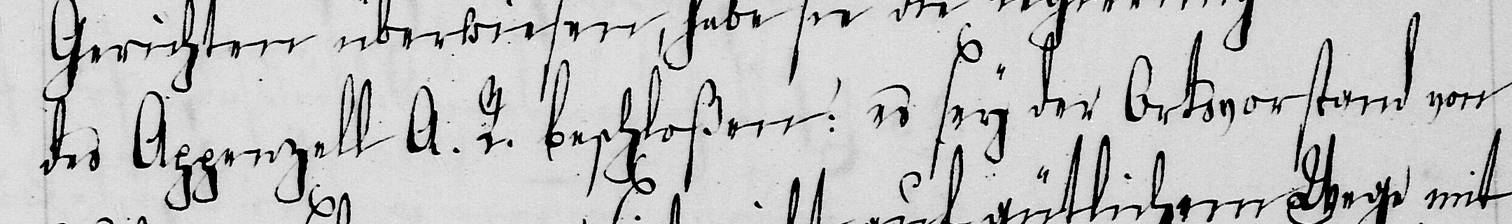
des Appenzell A. R. beschloßen: es sey der Ortsvorstand von
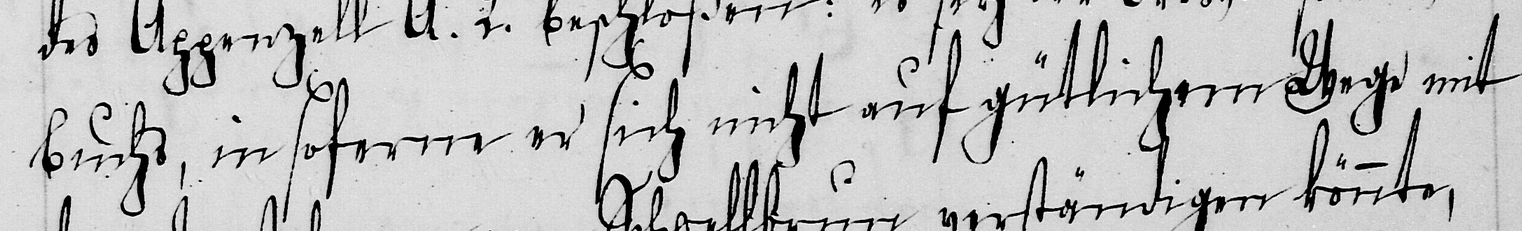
Buchs, in soferne er sich nicht auf gütlichem Wege mit
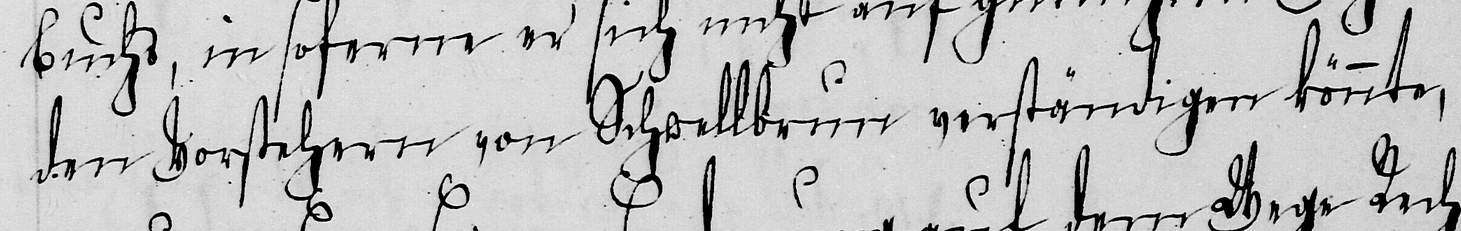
den Vorstehern von Schwellbrunn verständigen könnte,
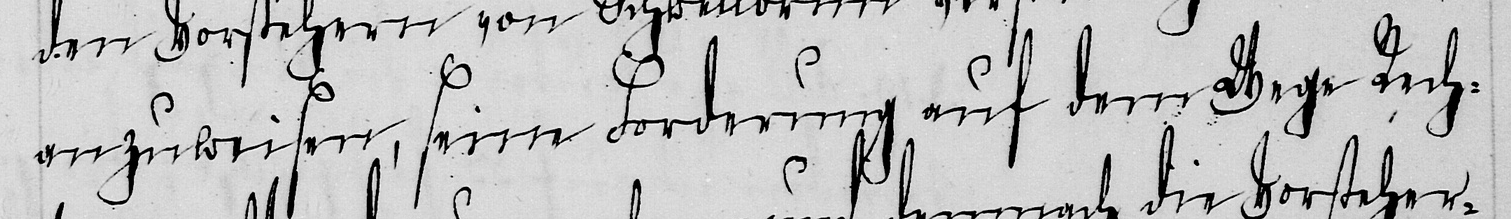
anzuweisen, seine Forderung auf dem Wege Rech¬
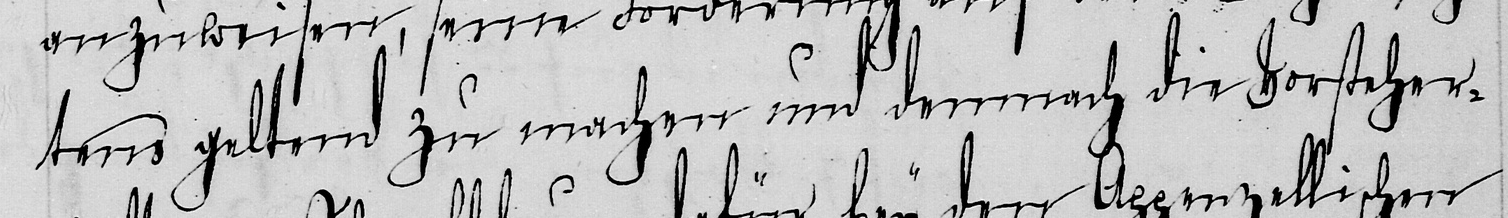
tens geltend zu machen und demnach die Vorsteher¬
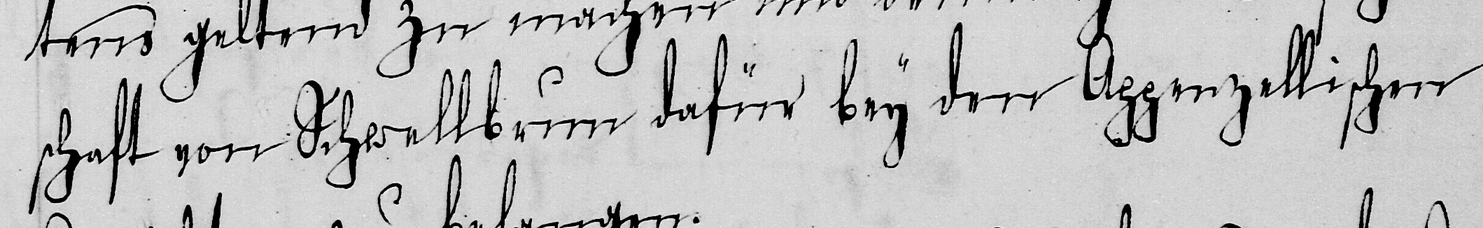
schaft von Schwellbrunn dafür bey den Appenzellischen
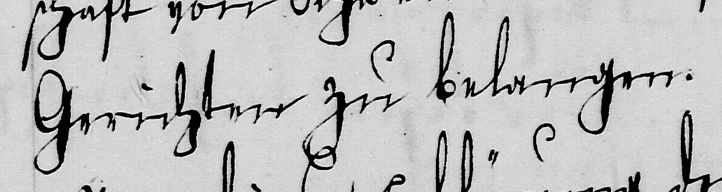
Gerichten zu belangen.
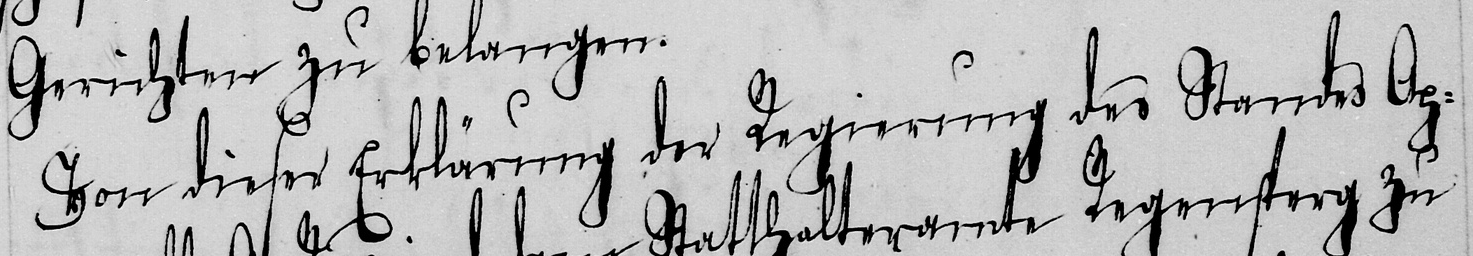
Von dieser Erklärung der Regierung des Standes Ap¬
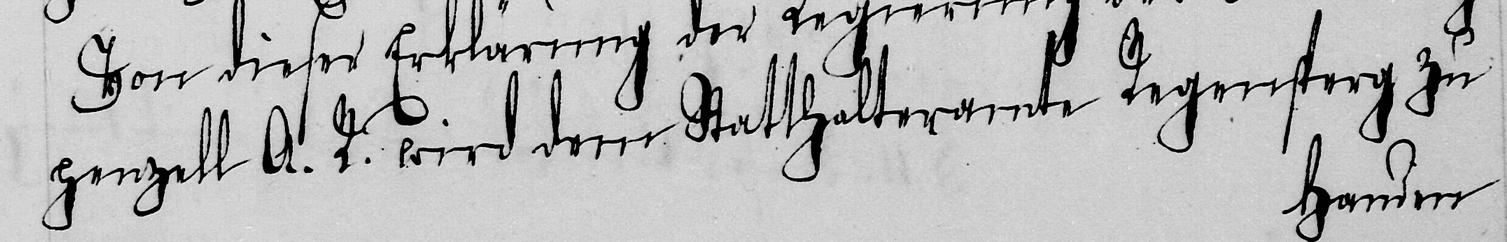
penzell A. R. wird dem Statthalteramte Regensperg zu
